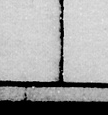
n.
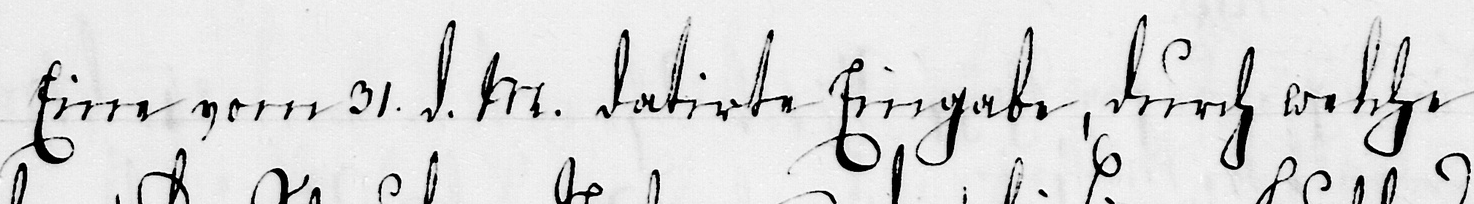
Eine vom 31. d. M. datirte Eingabe, durch welche
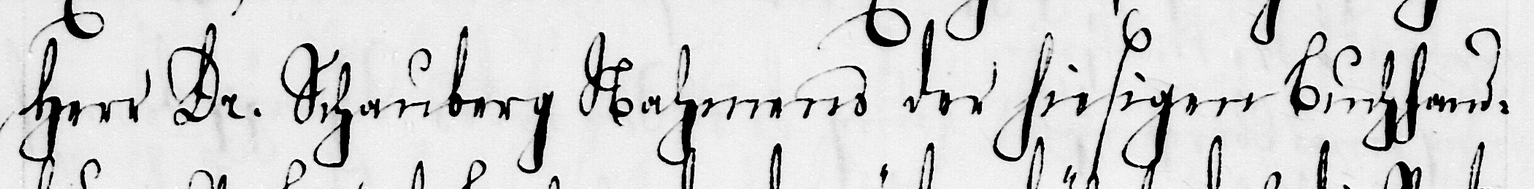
Herr Dr. Schauberg Nahmens der hiesigen Buchhand¬
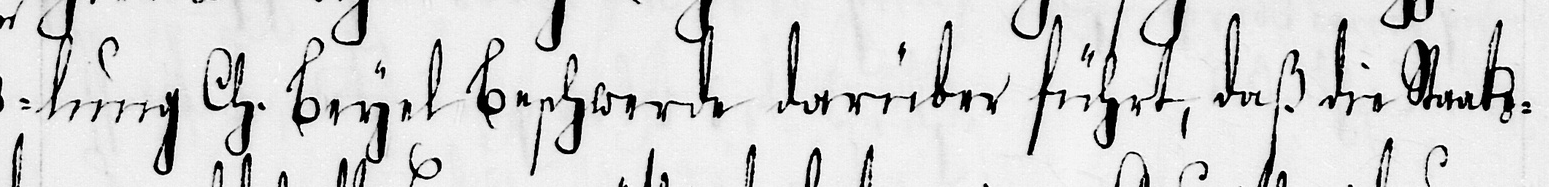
lung Ch. Beyel Beschwerde darüber führt, daß die Staat¬
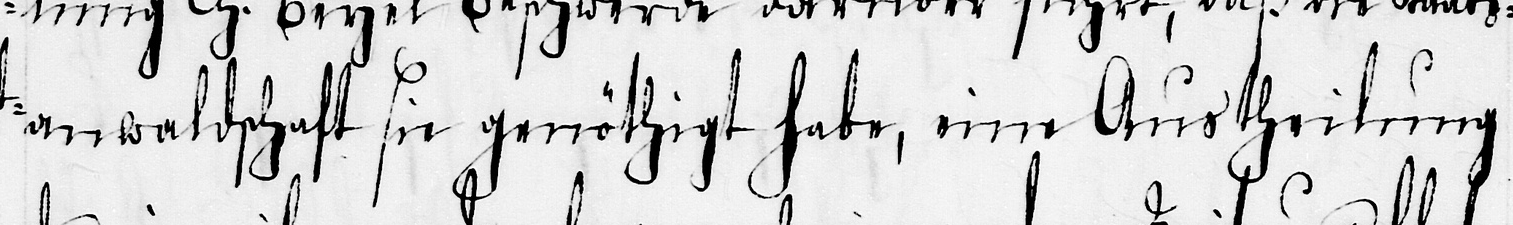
sanwaldschaft sie genöthigt habe, eine Austheilung
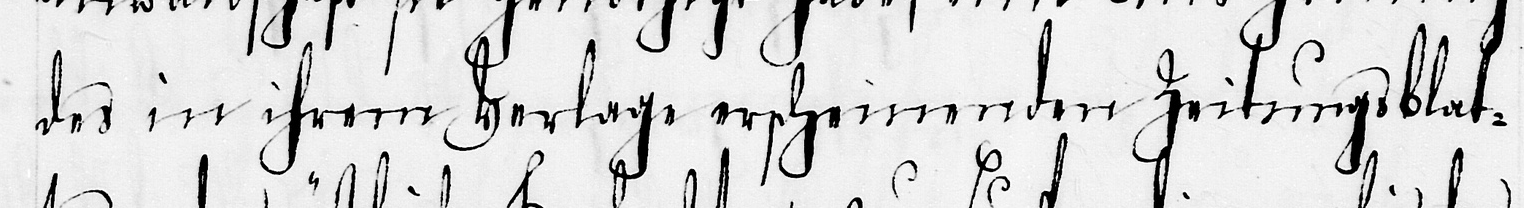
des in ihrem Verlage erscheinenden Zeitungsblat¬
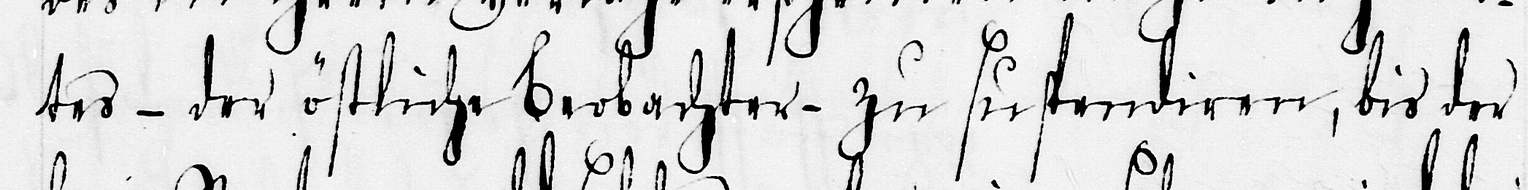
tes – der östliche Beobachter – zu suspendiren, bis der
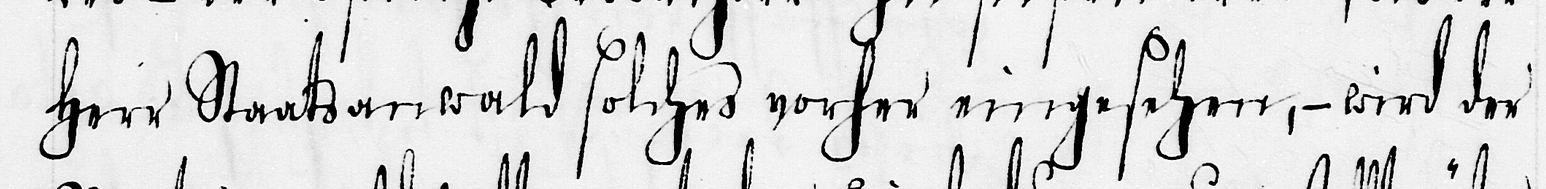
Herr Staatsanwald solches vorher eingesehen, − wird der
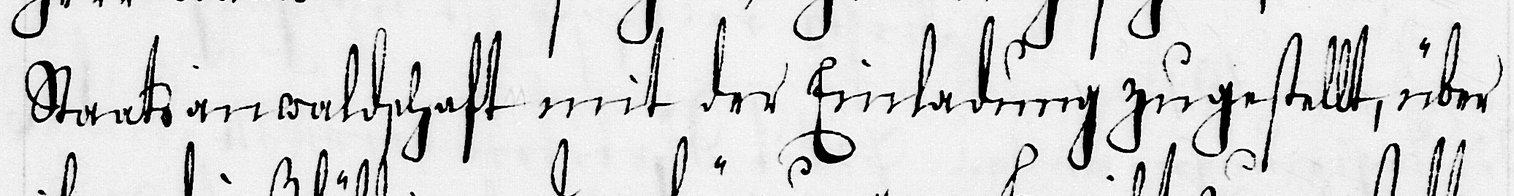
Staatsanwaldschaft mit der Einladung zugestellt, üb¬
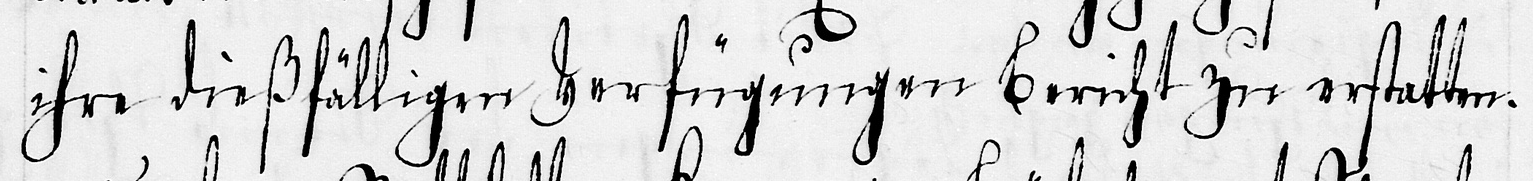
ihre dießfälligen Verfügungen Bericht zu erstatte¬
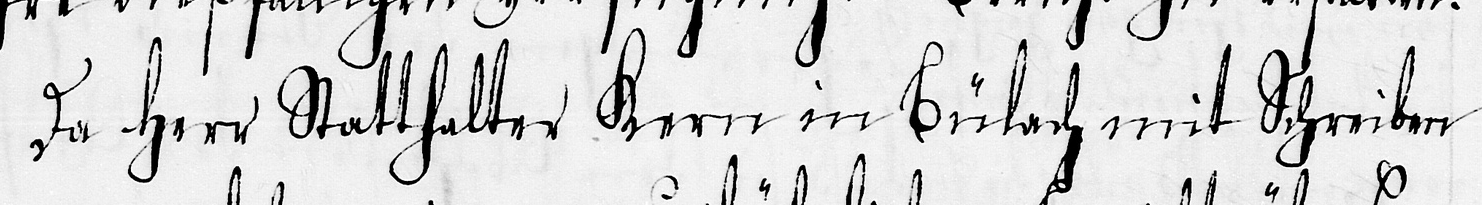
Da Herr Statthalter Kern in Bülach mit Schreiben
